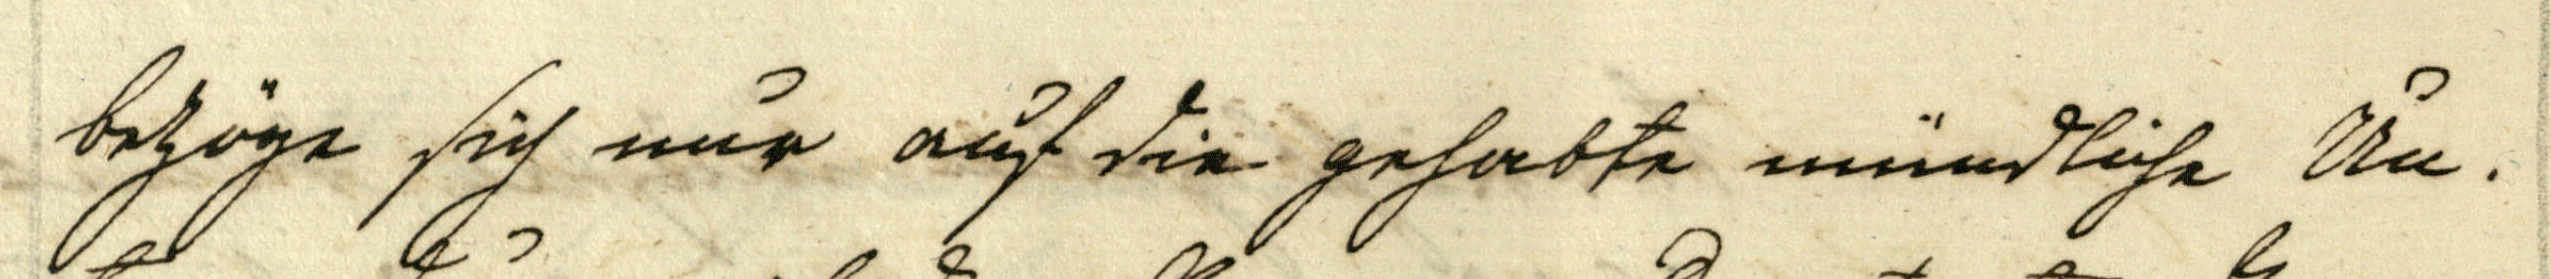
bezöge sich nur auf die gehabte mündliche Un¬
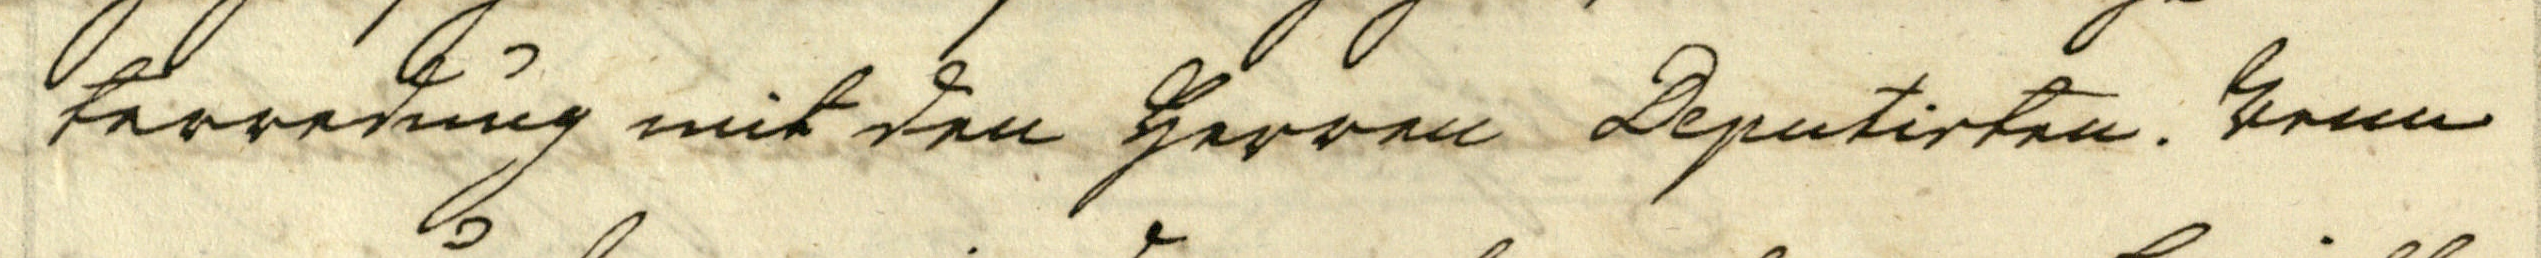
terredung mit den Herren Deputirten. Wenn
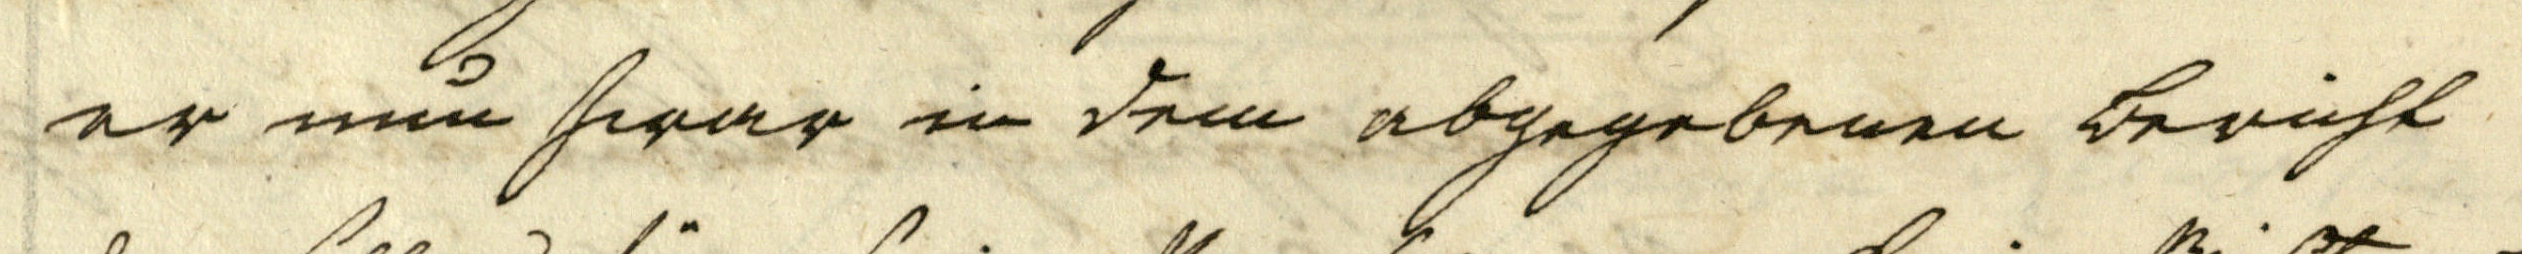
er nun zwar in dem abgegebenen Bericht
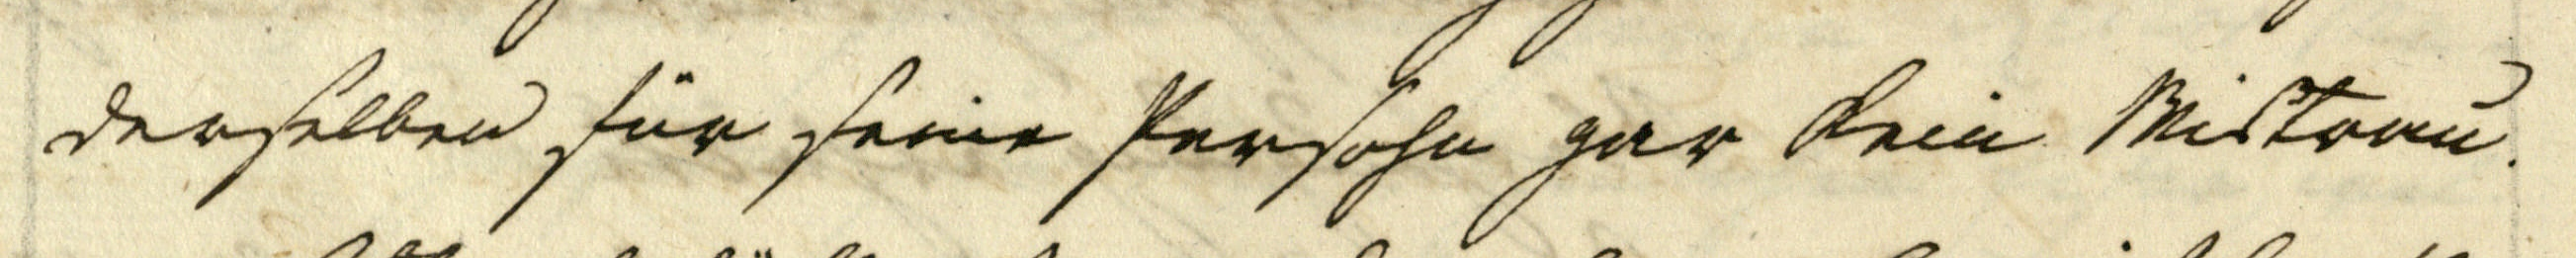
derselben für seine Persohn gar kein Mistrau¬
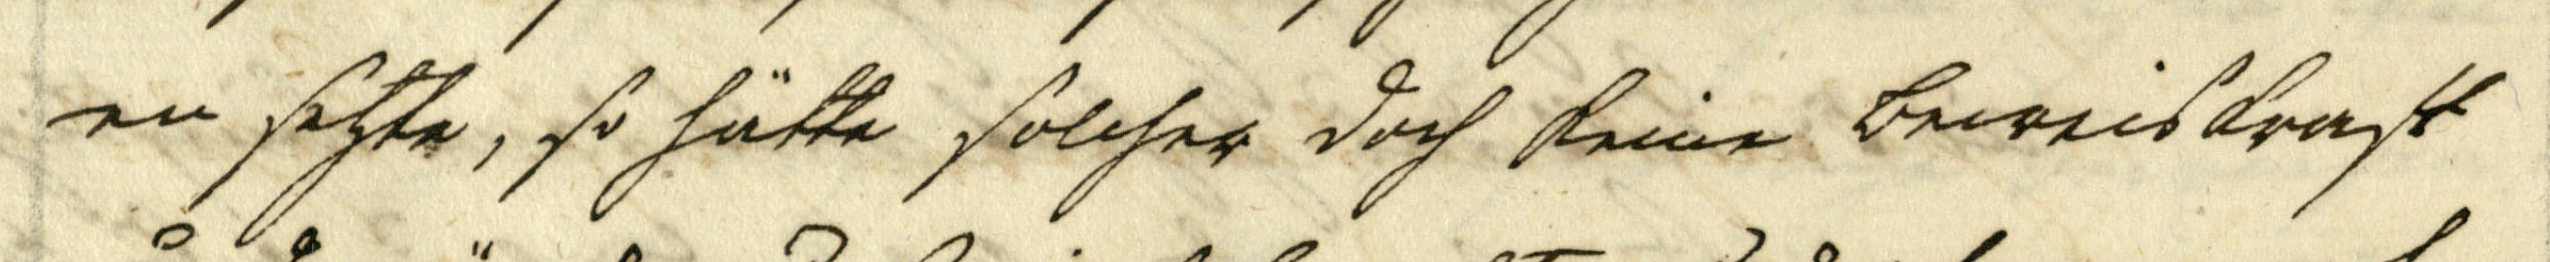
en setzte, so hätte solcher doch keine Beweiskraft
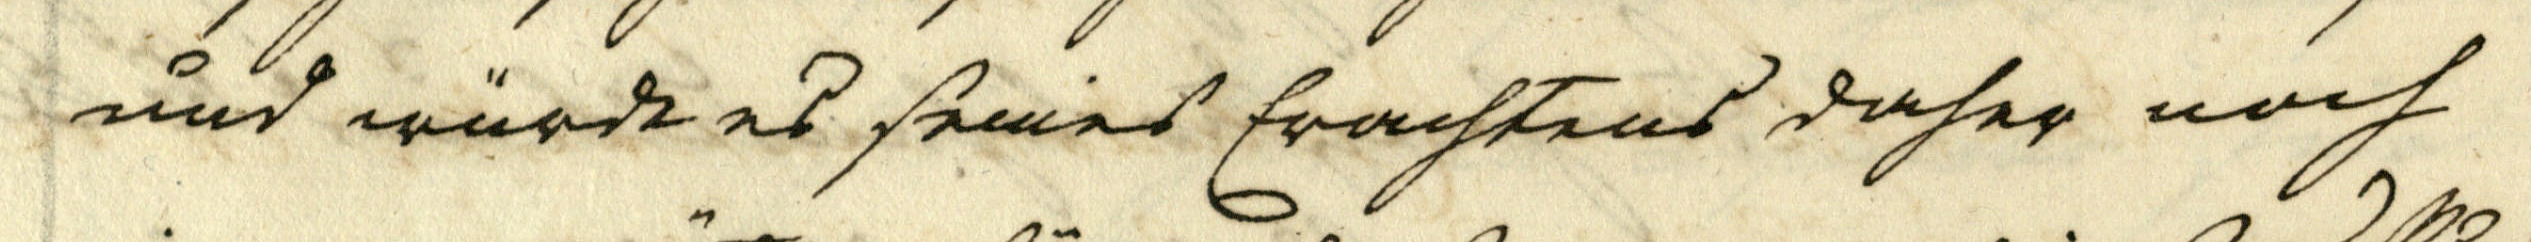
und würde es seines Erachtens daher noch
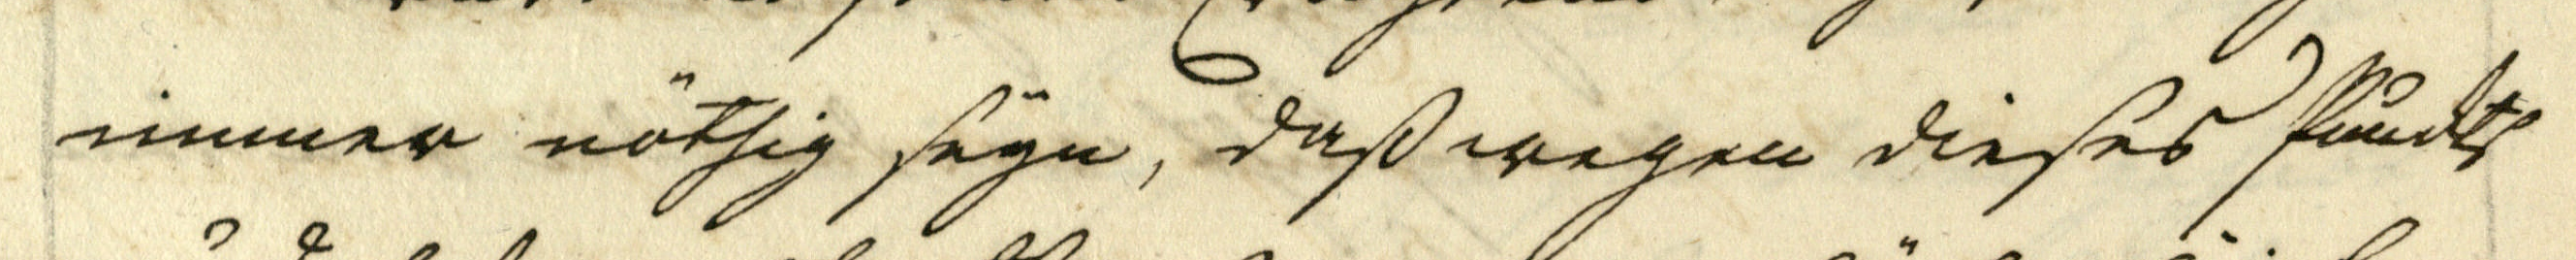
immer nöthig seÿn, daß wegen dieses Punckts
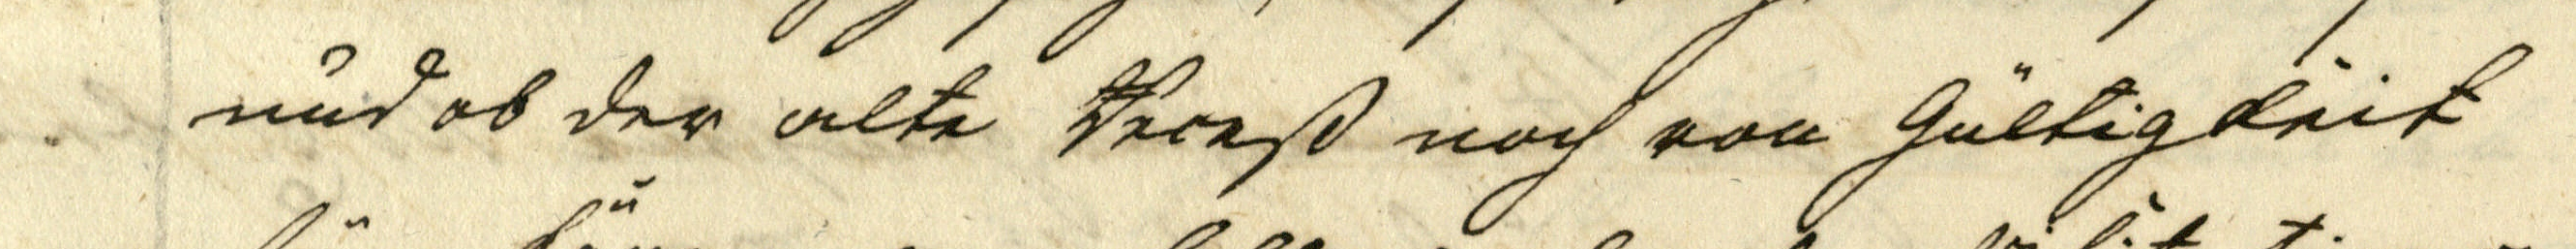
und ob der alte Receß noch von Gültigkeit
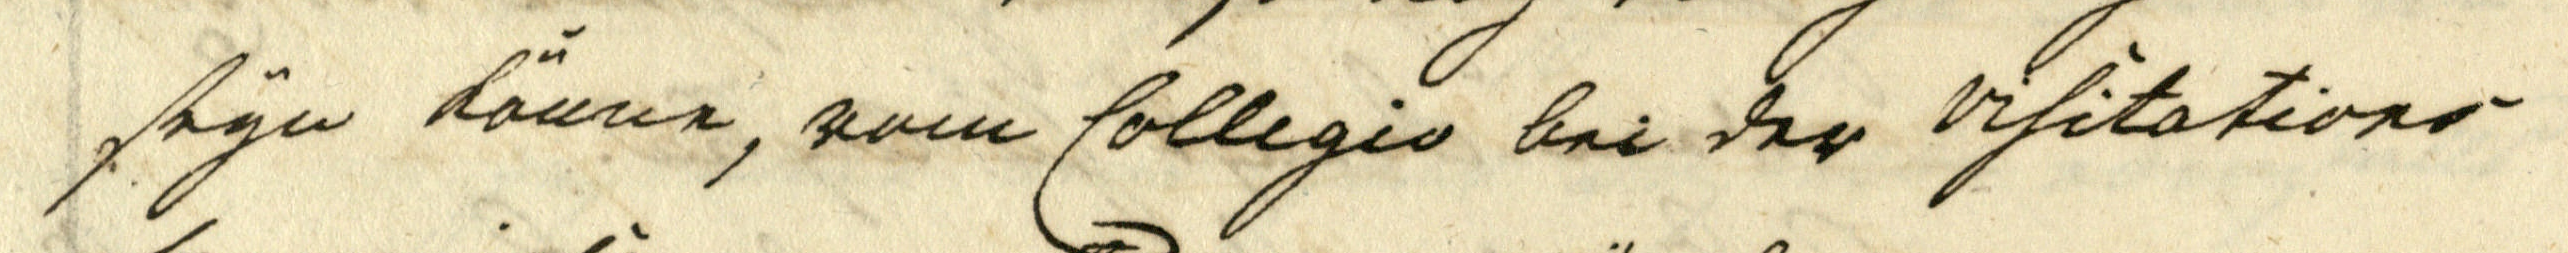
seÿn könne, vom Collegio bei der Visitations
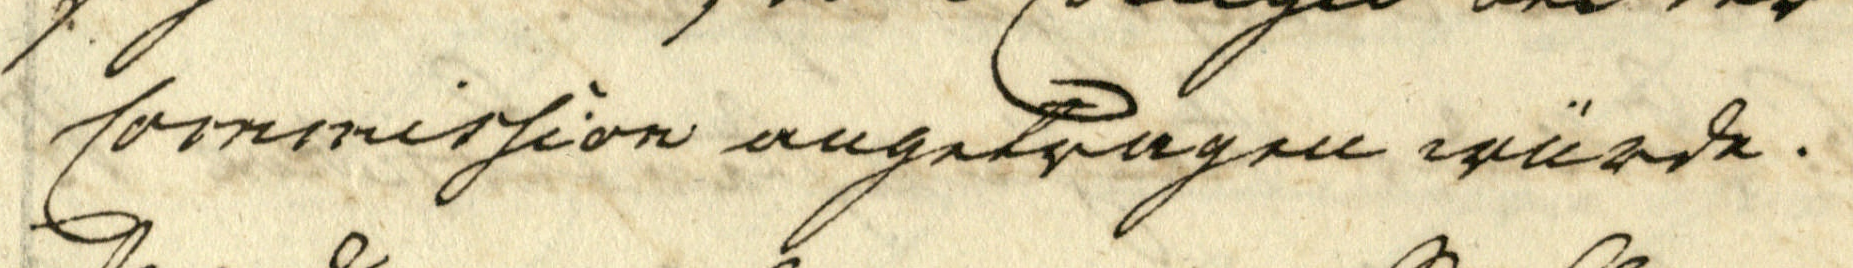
Commission angetragen würde.
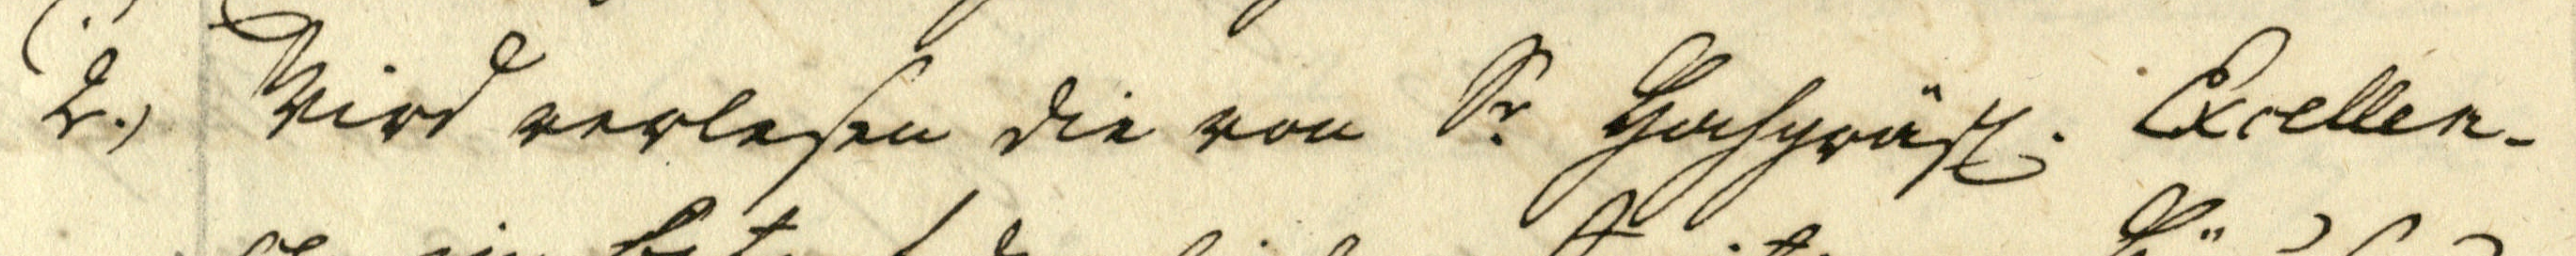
2., Wird verlesen die von Sr. Hochgräfl. Excellen¬
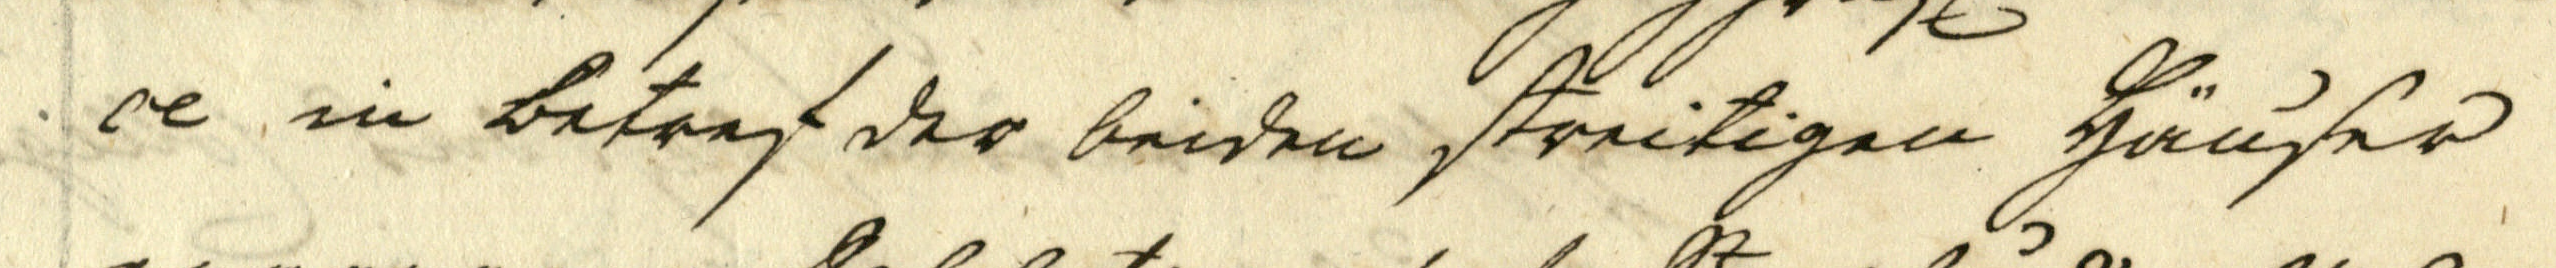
ce in Betref der beiden streitigen Häuser
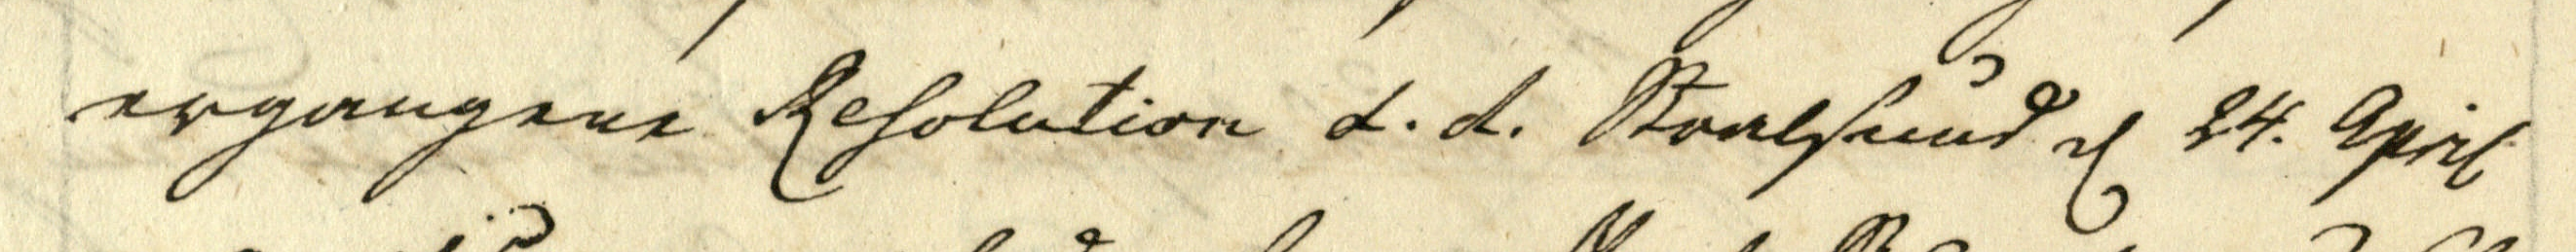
ergangene Resolution d. d. Stralsund d. 24. April
